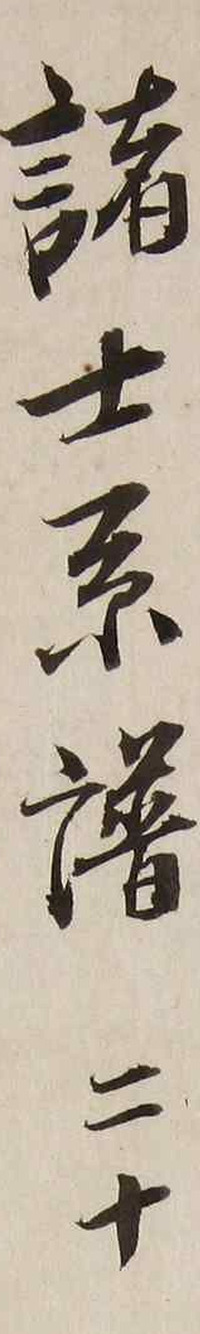諸士系譜二十

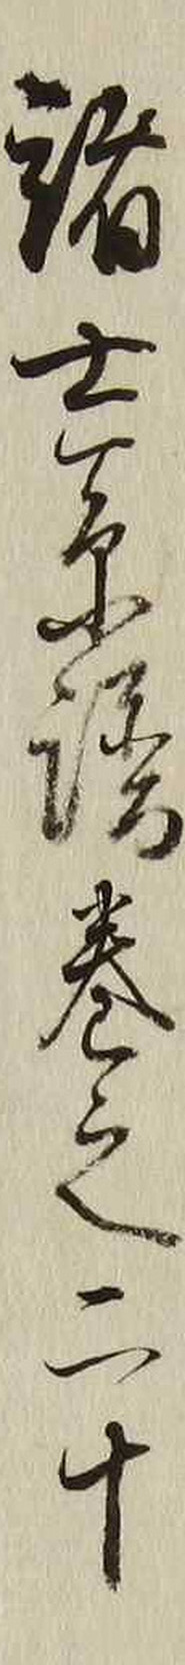諸士系譜巻之二十
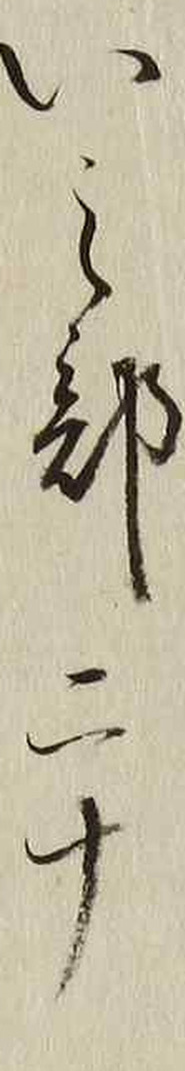い之部二十
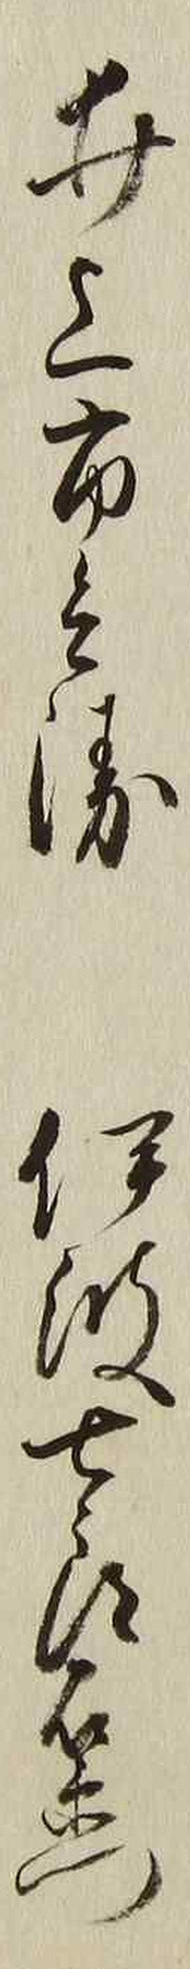井上市兵衛伊波七郎次右衛門
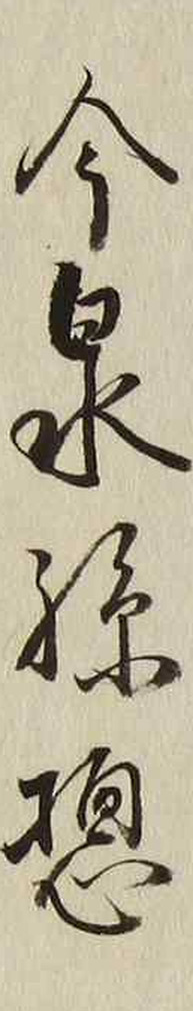今泉孫摠

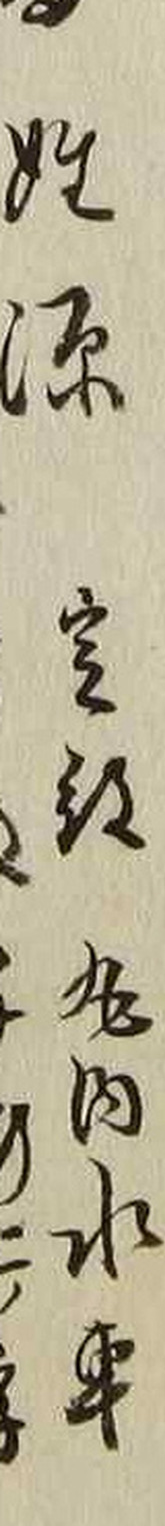姓源定紋丸内水車
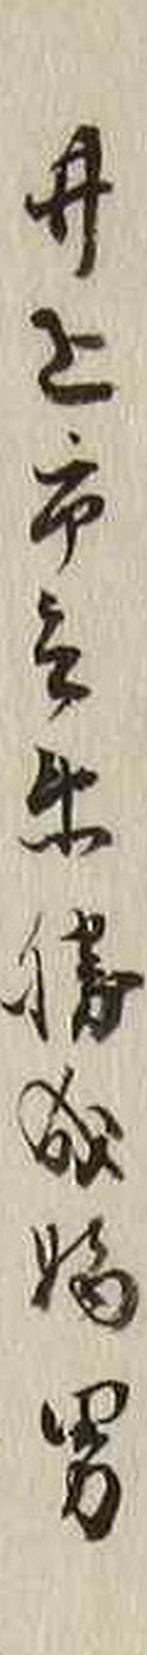井上市兵衛勝成嫡男
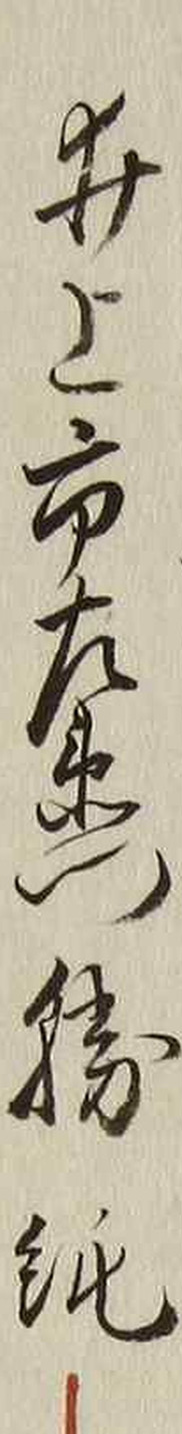井上市左衛門勝純
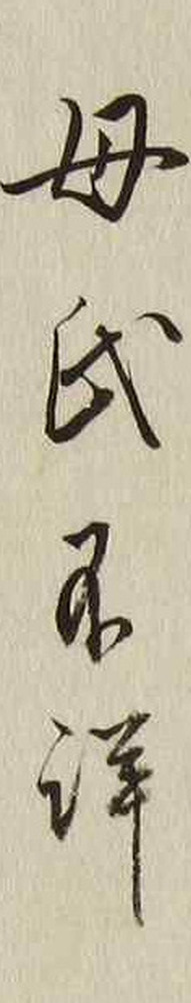母氏不詳
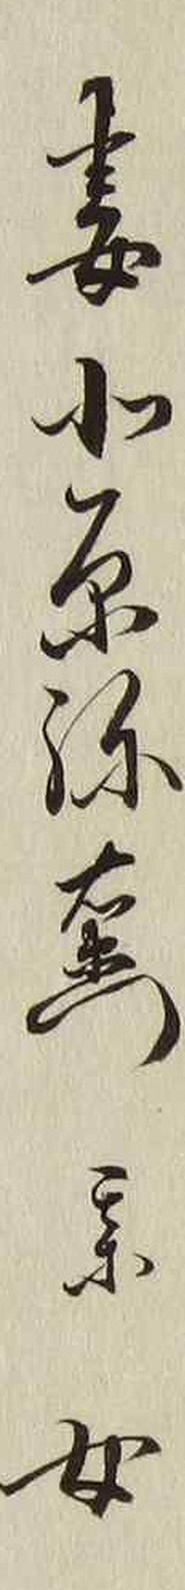妻小原弥右衛門某女
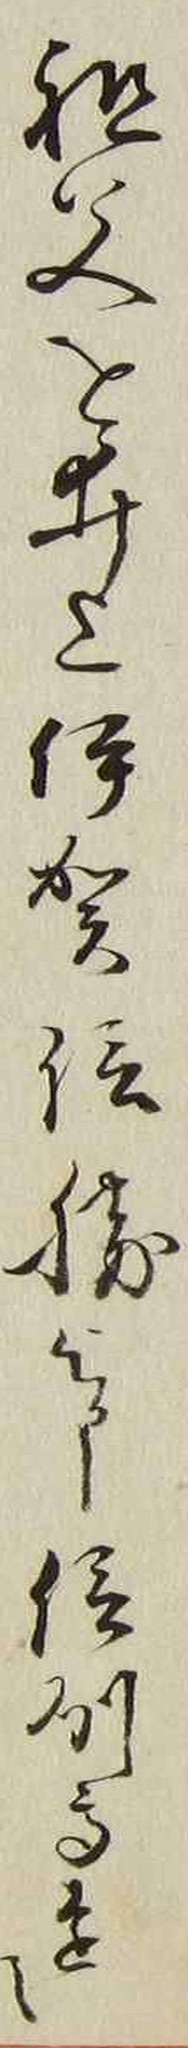祖父を井上伊賀信勝と申し信州高遠之
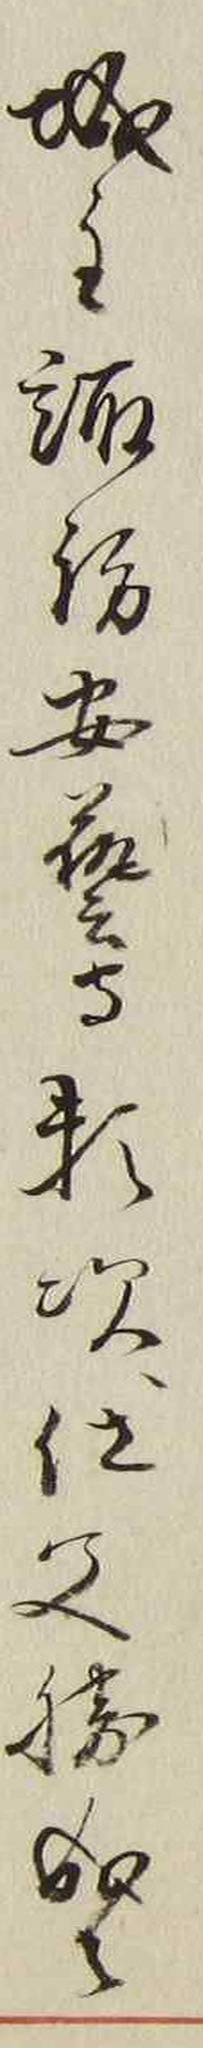城主諏訪安芸守頼次へ仕え父勝成之

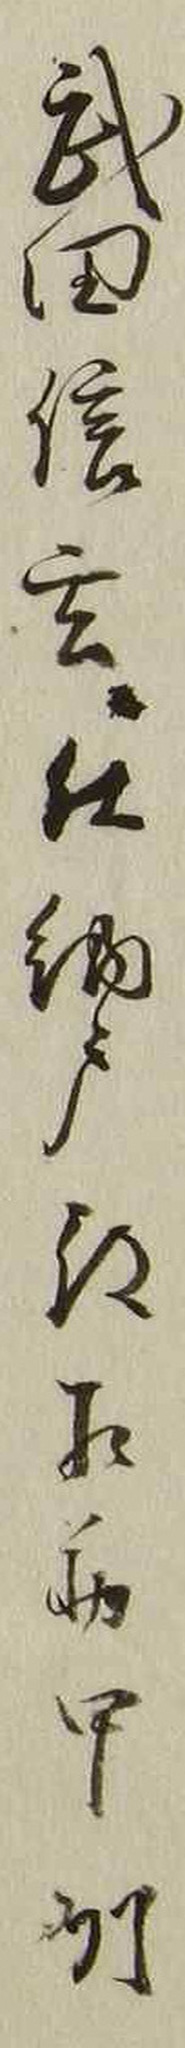武田信玄へ仕え納戸役相勤め甲州
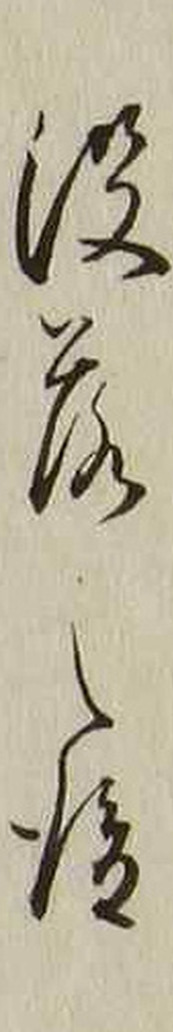没落之後
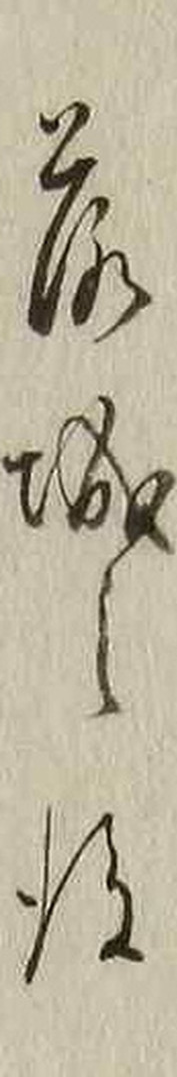落城之後
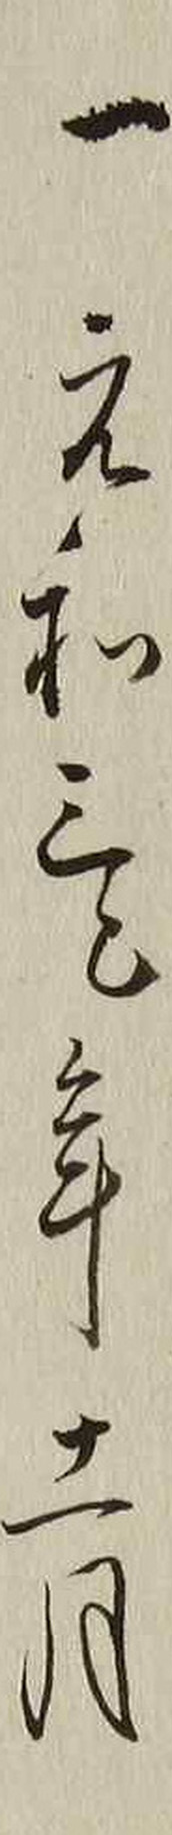一元和三巳年十一月
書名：諸士系譜　巻之20　い之部20
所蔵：会津若松市立会津図書館
